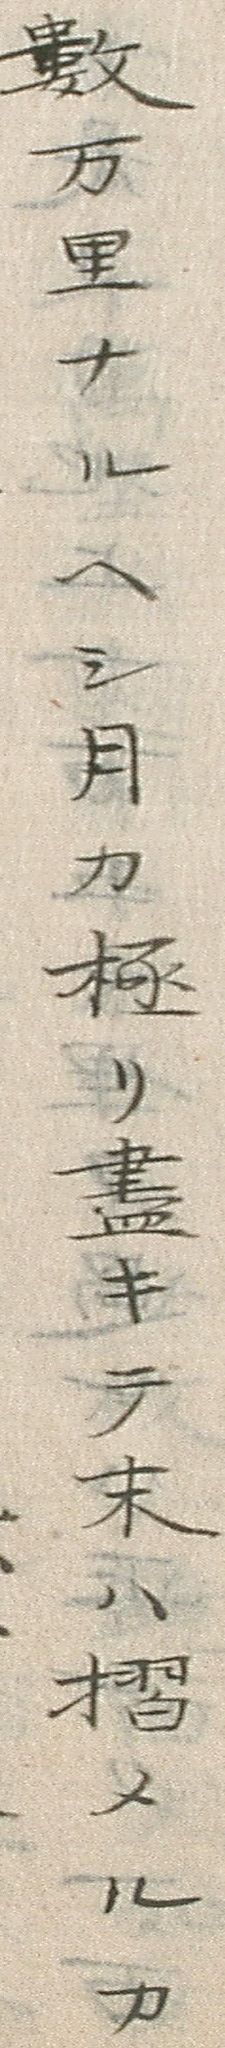数万里ナルヘシ月カ極リ尽キテ末ハ摺メルカ
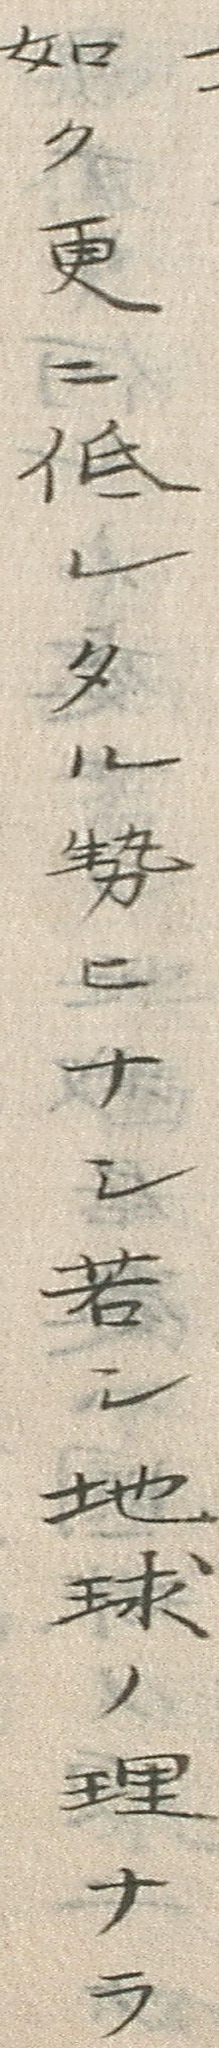如ク更ニ低レタル勢ヒナシ若シ地球ノ理ナラ
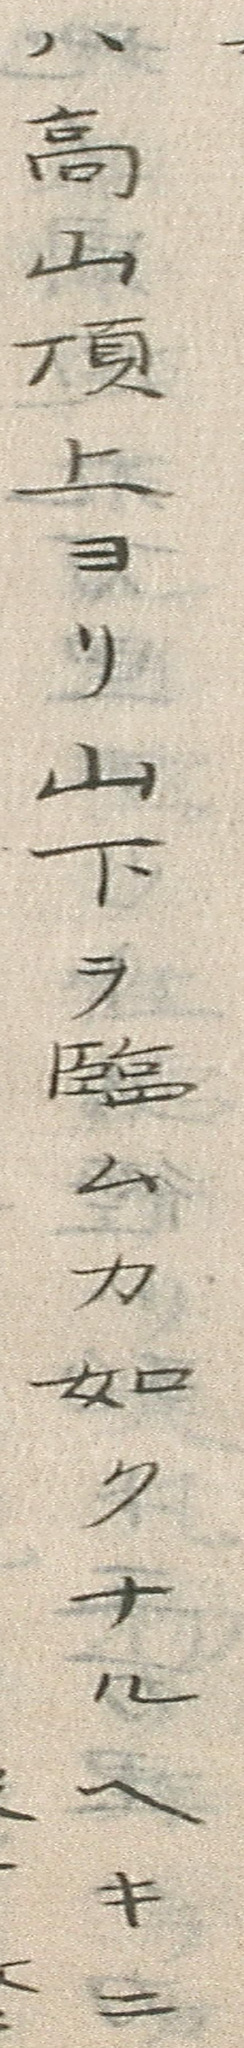ハ高山頂上ヨリ山下ヲ臨ムカ如クナルヘキニ
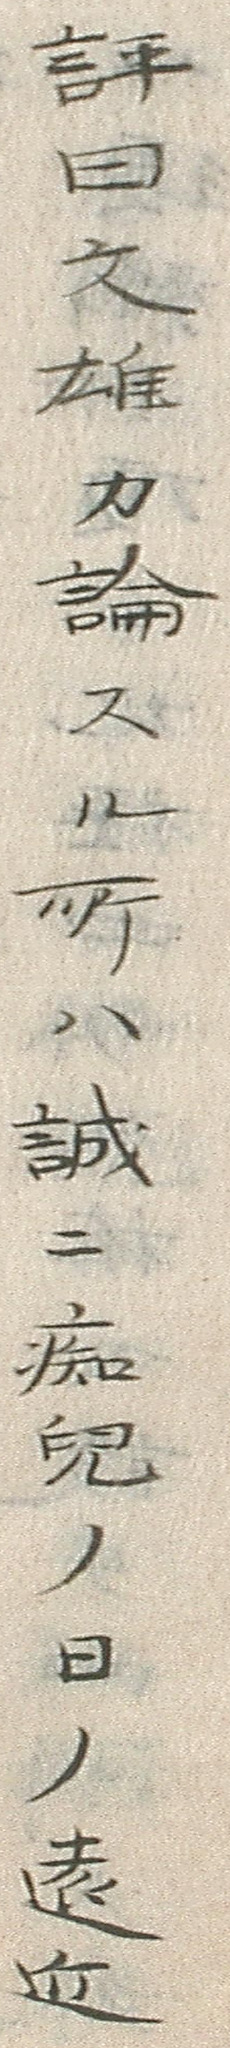評曰文雄カ論スル所ハ誠ニ痴児ノ日ノ遠近
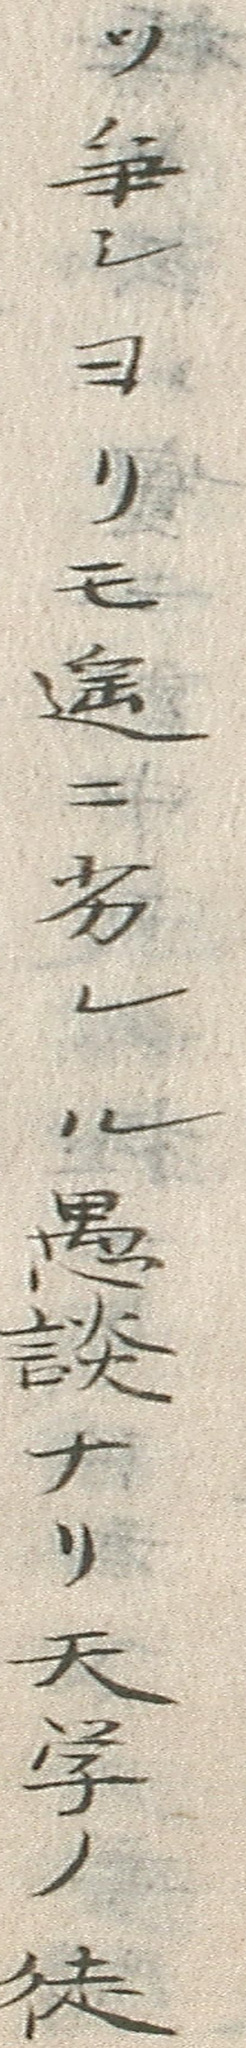ノ争シヨリモ遥ニ劣レル愚談ナリ天学ノ徒
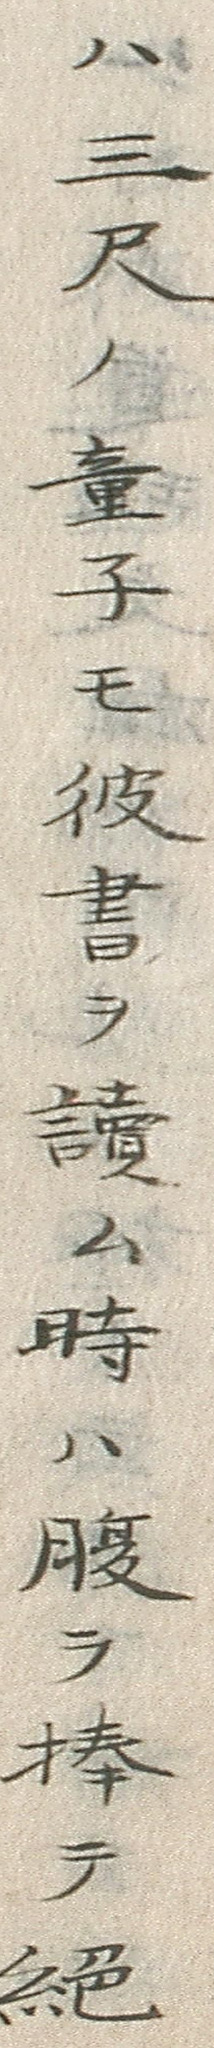ハ三尺ノ童子モ彼書ヲ読ム時ハ腹ヲ棒テ絶
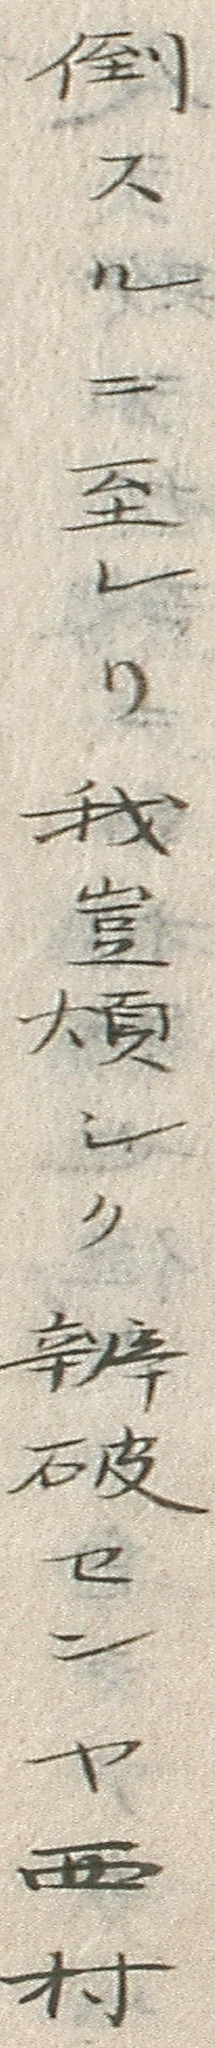倒スルニ至レリ我豈煩シク弁破センヤ西村
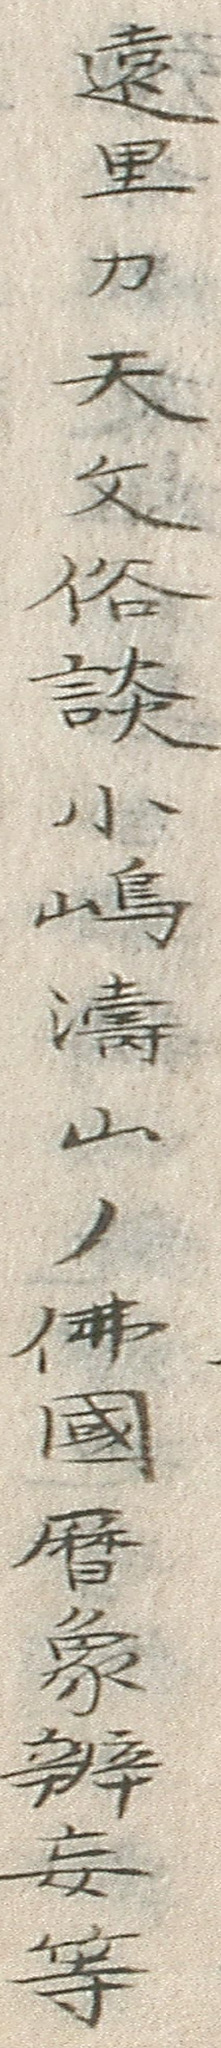遠里カ天文俗談小嶋濤山ノ仏国暦象弁妄等
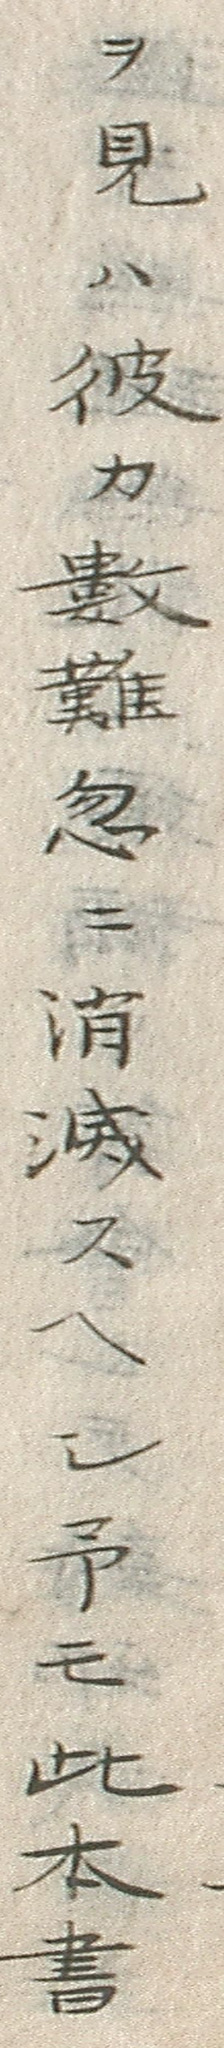ヲ見ハ彼カ数難忽ニ消滅スヘシ予モ此本書
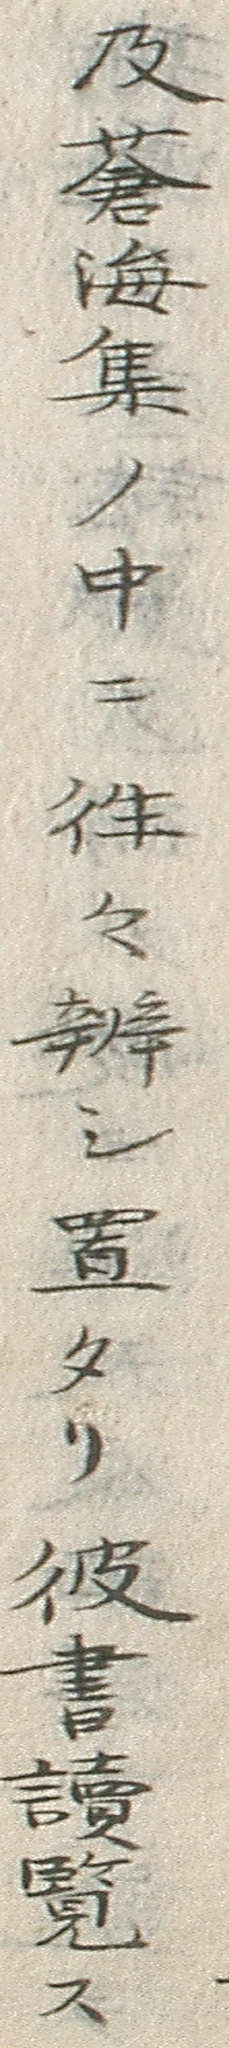及蒼海集ノ中ニ往々弁シ置タリ彼書読覧ス
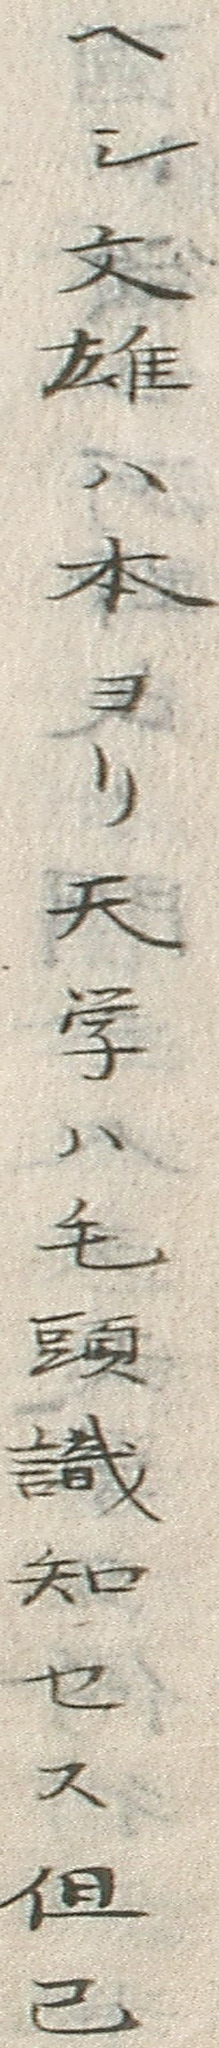ヘシ文雄ハ本ヨリ天学ハ毛頭識知セス但己
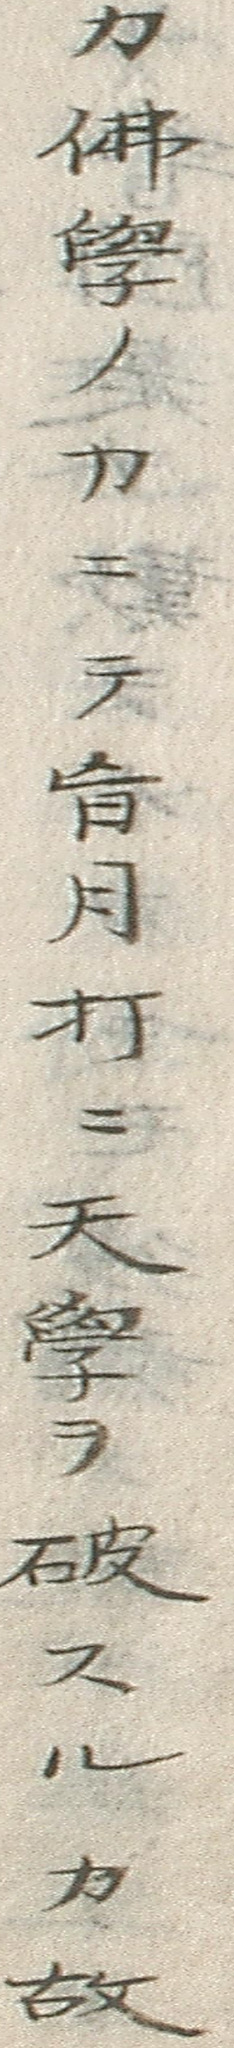カ仏学ノ力ニテ盲月打ニ天学ヲ破スルカ故
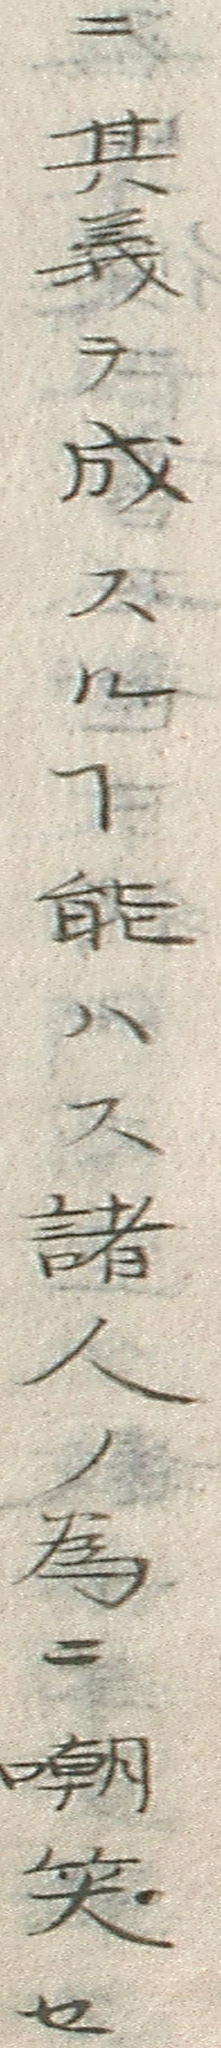ニ其義ヲ成スルコト能ハス諸人ノ為ニ嘲笑セ

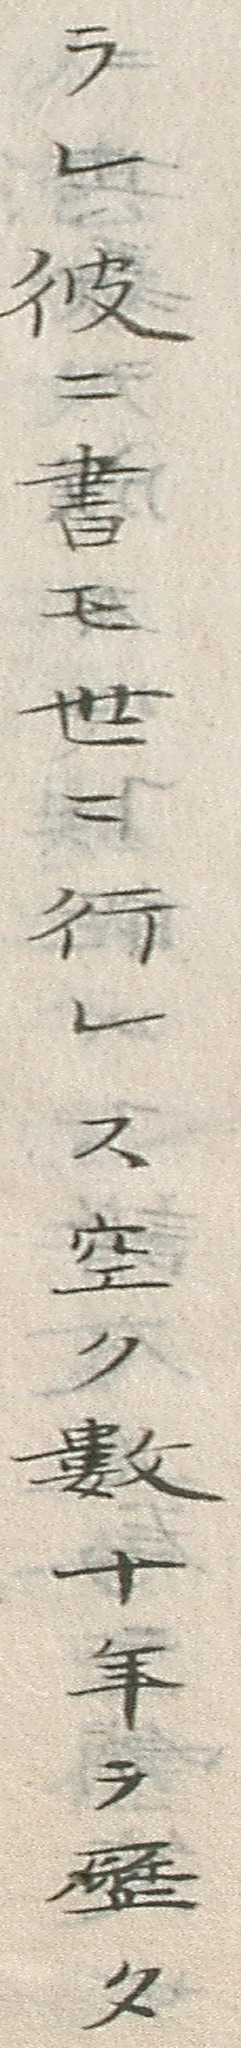ラレ彼ニ書モ世ニ行レス空ク数十年ヲ歴タ
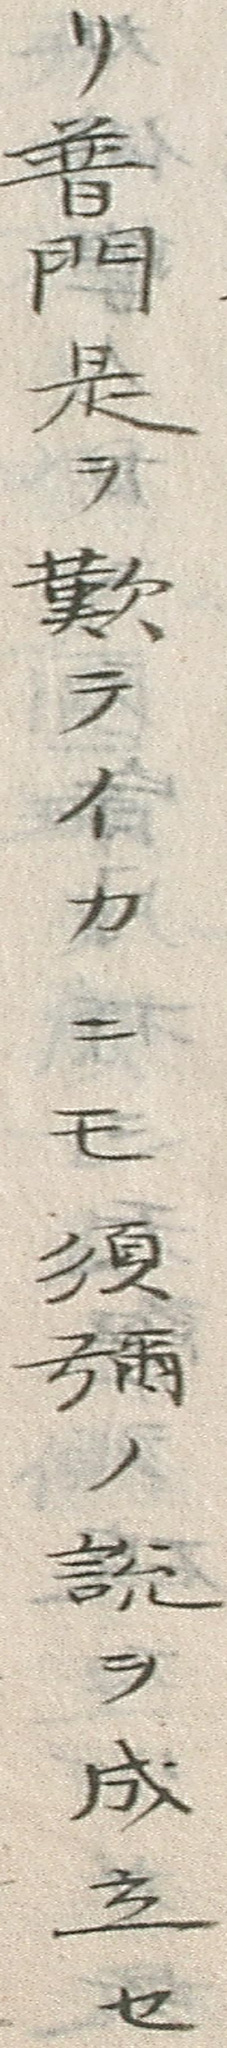リ普門是ヲ歎テイカニモ須弥ノ説ヲ成立セ
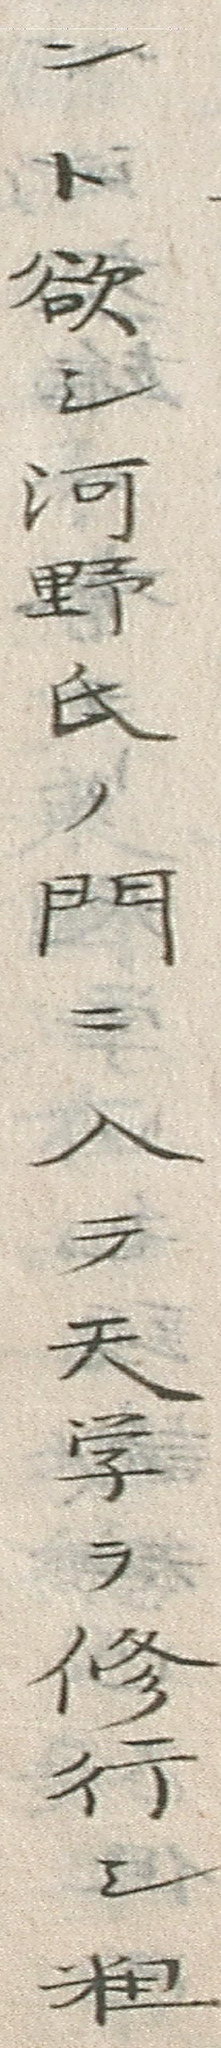ント欲シ河野氏ノ門ニ入テ天学ヲ修行シ粗
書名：天學略名目羽翼　全
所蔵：東京大学地震研究所図書室 Earthquake Research Institute Library, The University of Tokyo, JAPAN
